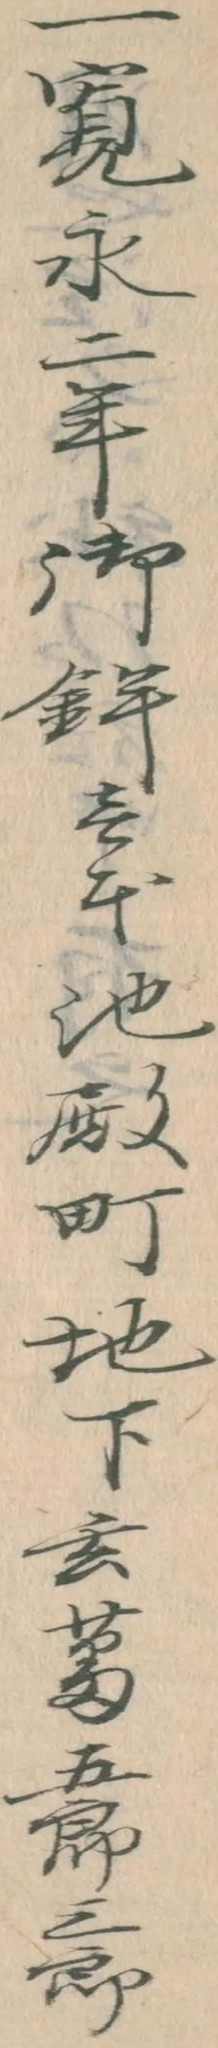一寛永二年御鉾壱本池殿町地下玄蕃五郎三郎
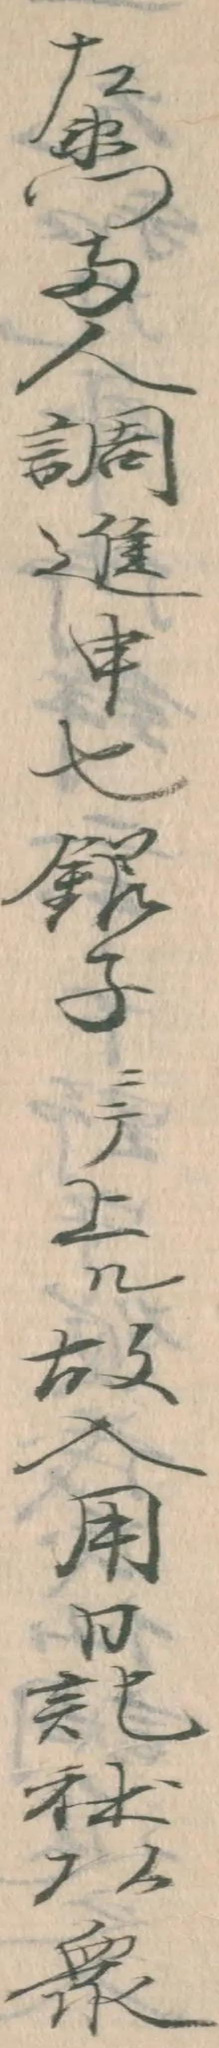左衛門両人調進申也銀子ニテ上ル故入用日記社頭衆
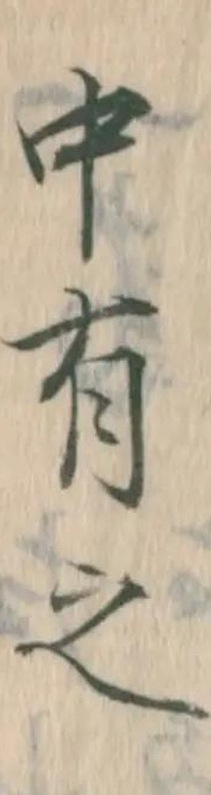中有之
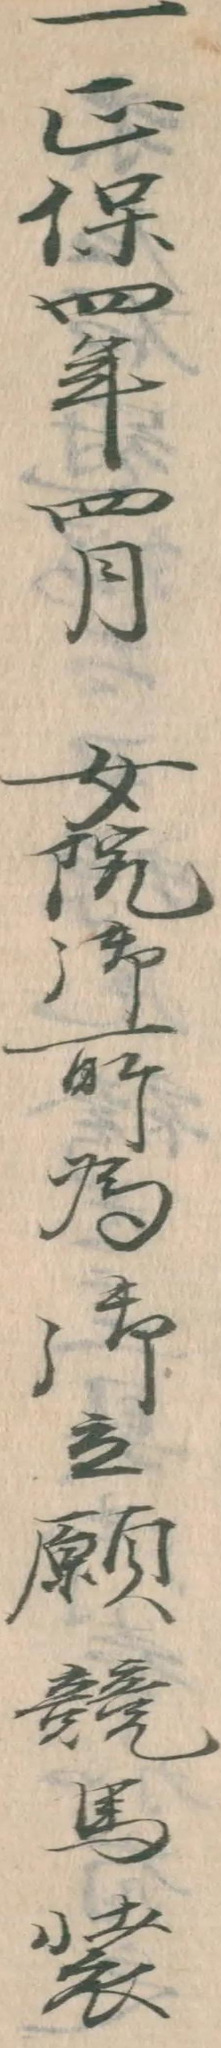一正保四年四月女院御所為御立願競馬装
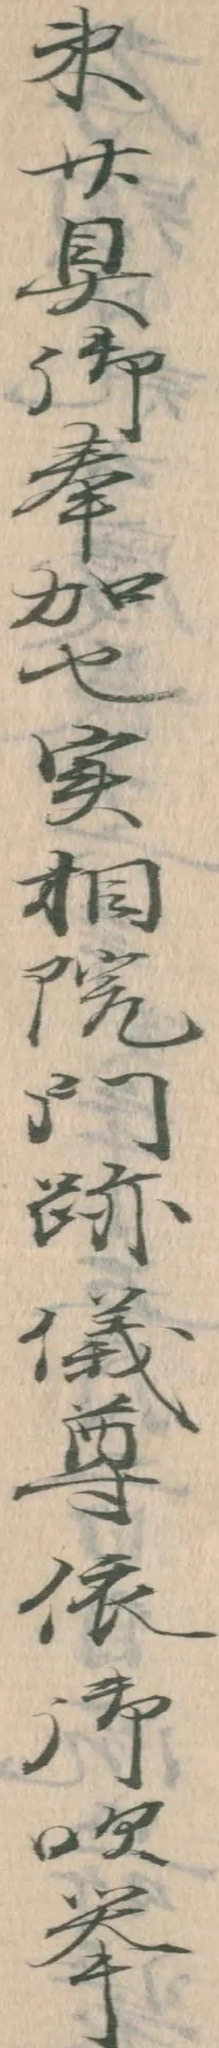束廿具御奉加也実相院門跡儀尊依御吹挙
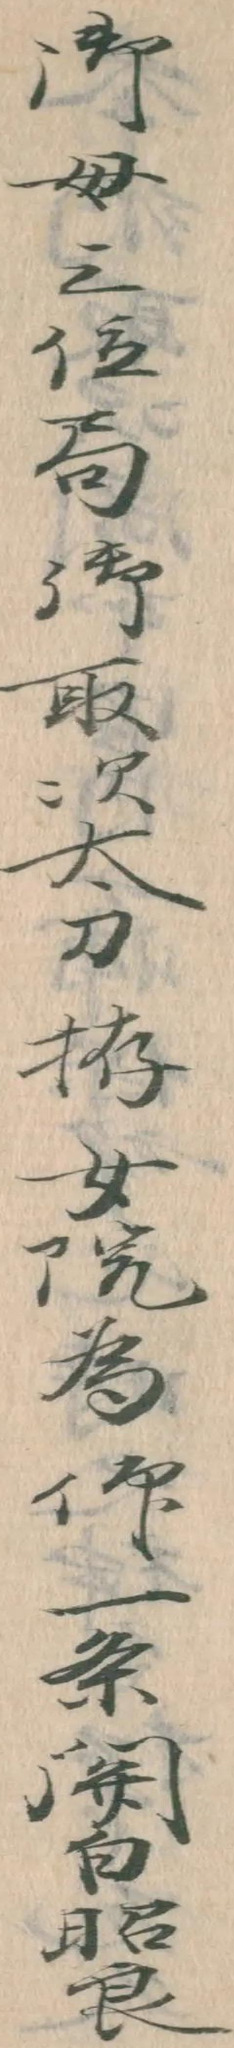御母三位局御取次太刀拵女院為仰一条関白昭良
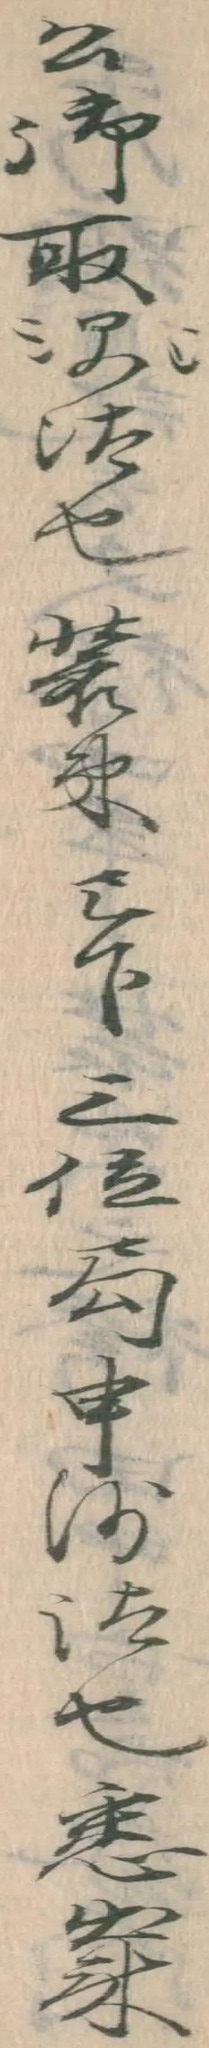公御取次汰也装束已下三位局申沙汰也悉出来
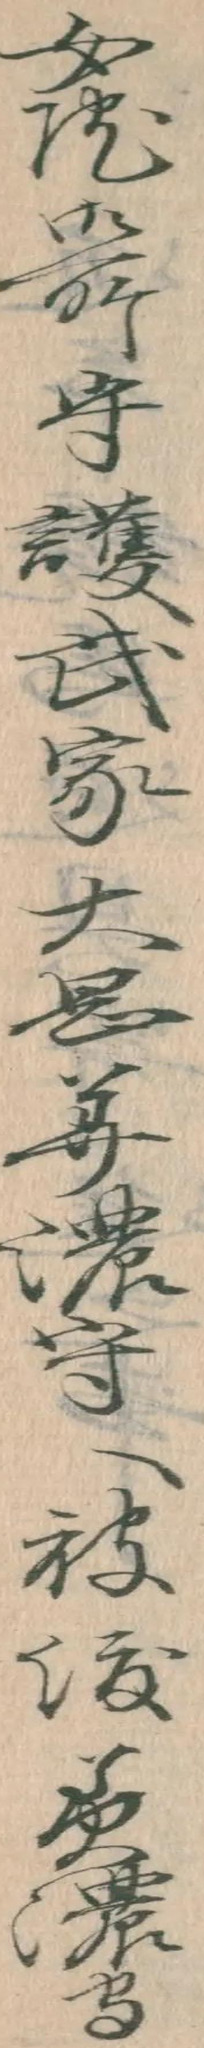女院御所守護武家大岡美濃守へ被渡美濃守
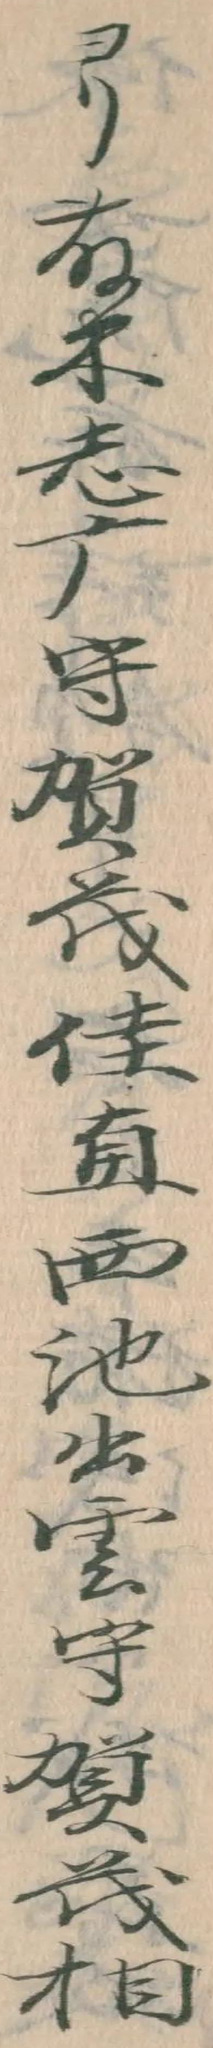ヨリ藤木志摩守賀茂佳直西池出雲守賀茂相
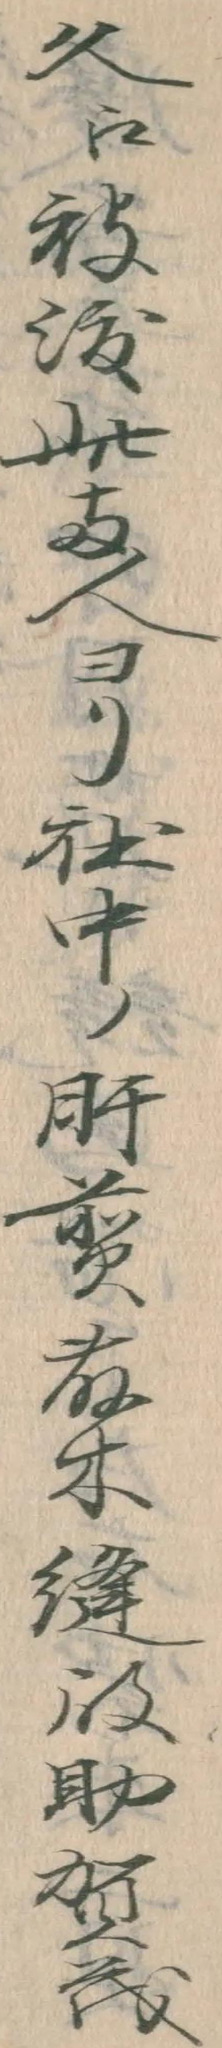久江被渡此両人ヨリ社中ノ肝煎藤木縫殿助賀茂
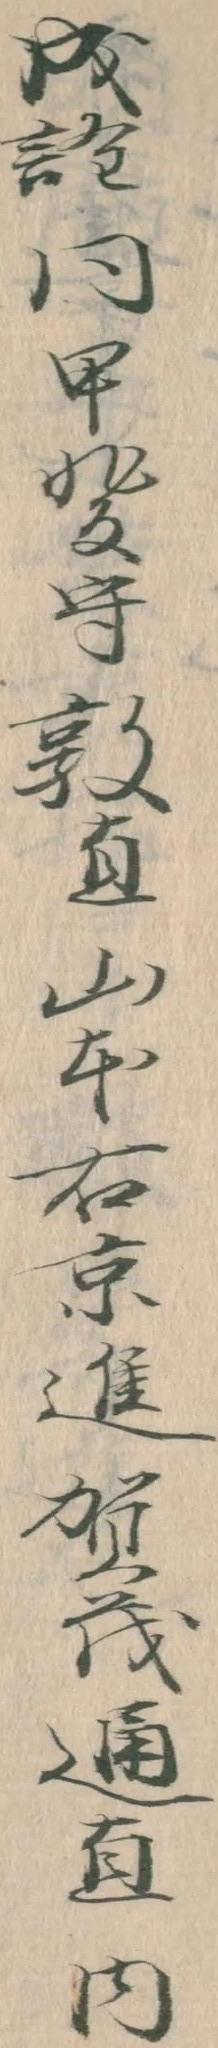成證同甲斐守敦直山本右京進賀茂通直内
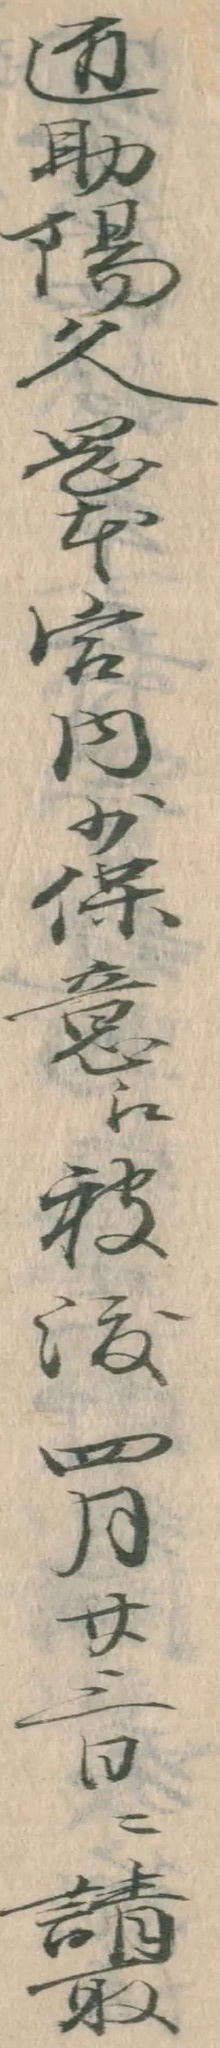通助陽久岡本宮内少保意江被渡四月廿三日ニ請取
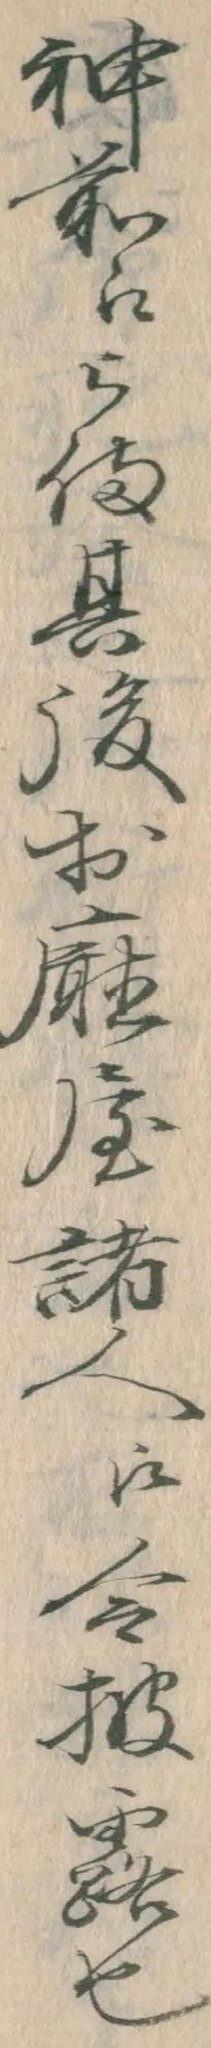神前江被備其後於庁屋諸人江令披露也
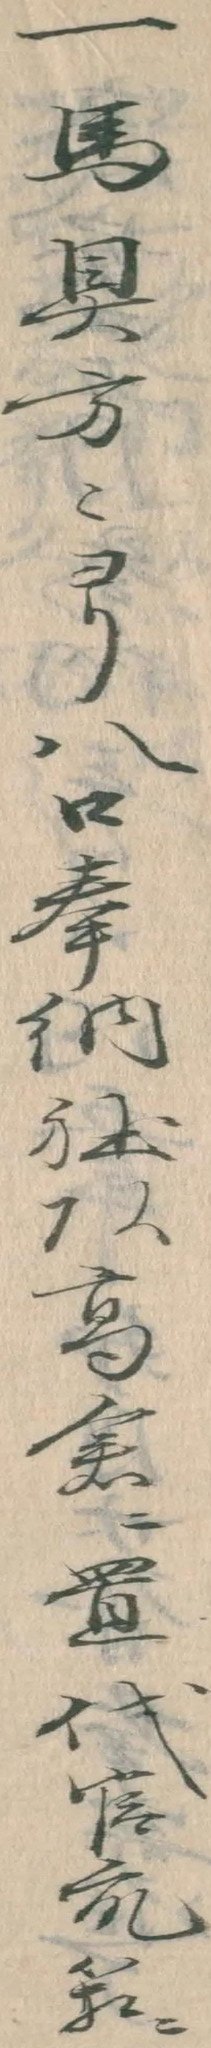一馬具方ニヨリ八口奉納社頭高倉ニ置代官衆箱ニ
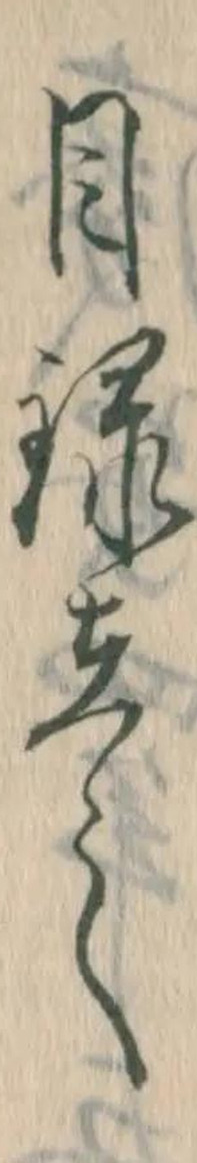目録在之
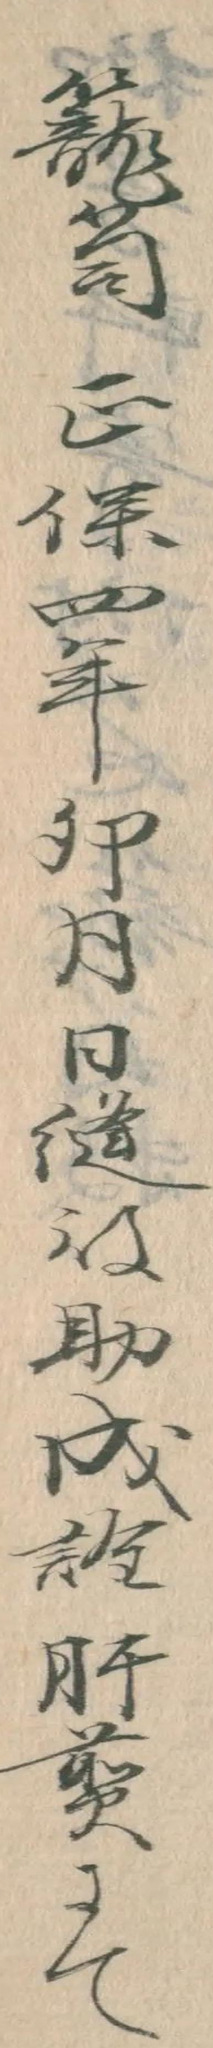一籠笥正保四年卯月日縫殿助成詮肝煎にて
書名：賀茂社記録. 第11冊
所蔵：国立国会図書館 National Diet Library, JAPAN
